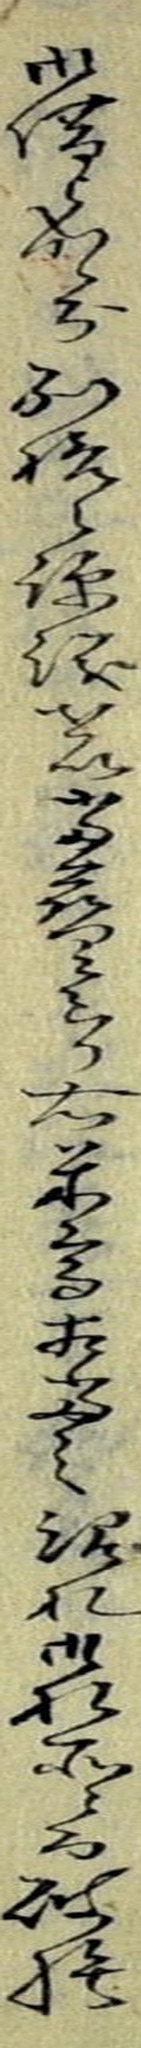御借被成候分別格之評儀を以当暮に至り右米高相当之銀札御札所に而破捨
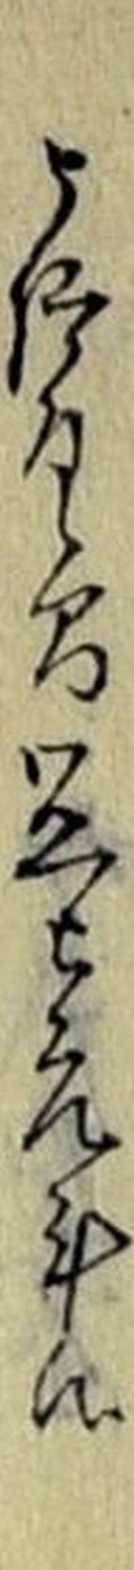被仰付候間宜被取斗候
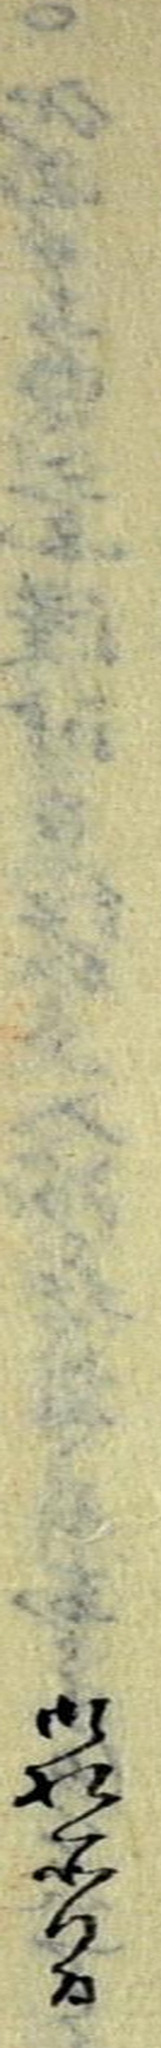御札所目付
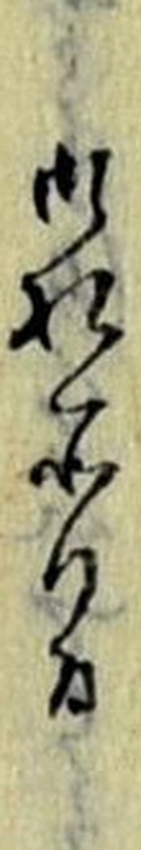御札所目付
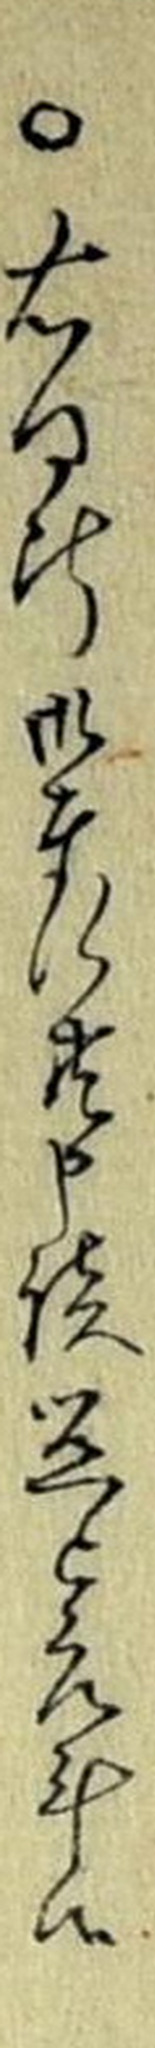○右同断御奉行共申談宜被取斗候
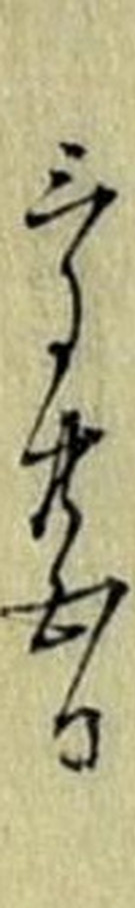三月廿五日
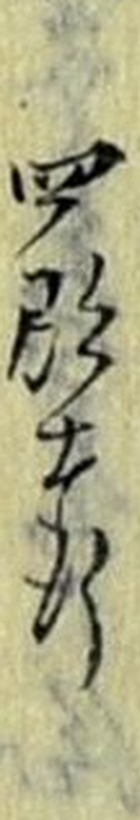四郡奉行
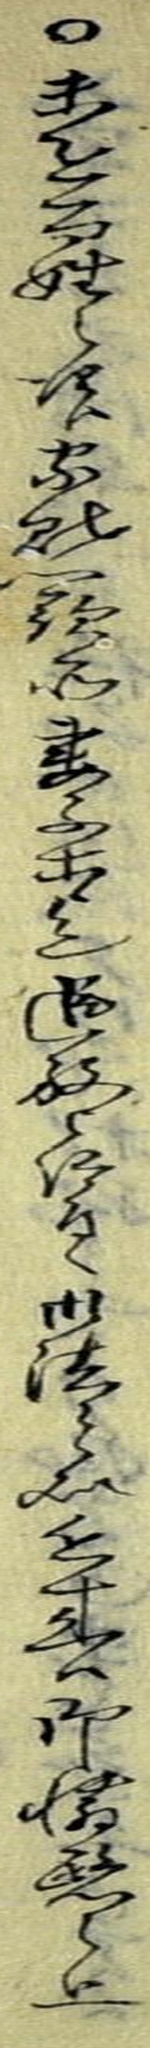○未進百姓之儀は家財闕所妻子等迄追放被仰付候御法に候処近来は御憐愍之上

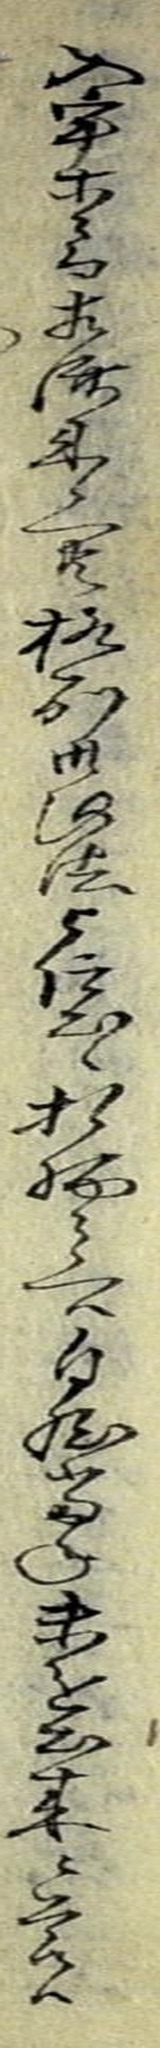入牢等に而相済来候へ共格別御趣法被仰出候折柄に候へは自然当年未進出来候節は
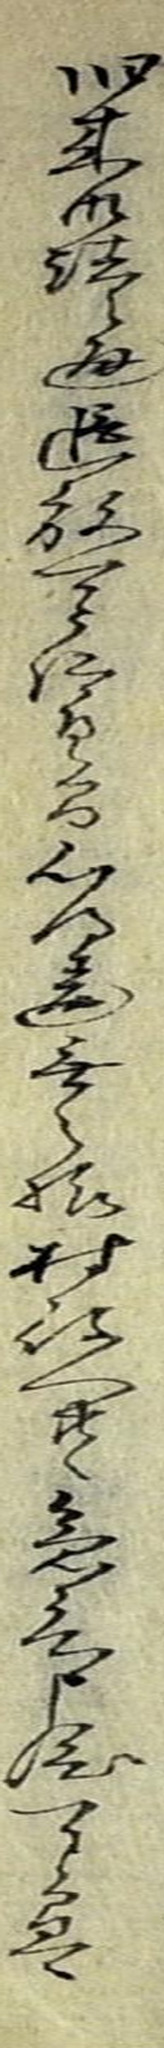旧來御法之通追放可被仰付候間心得違無之様村役人共へ急度申渡可被置候
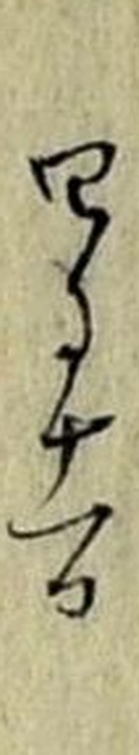四月十一日
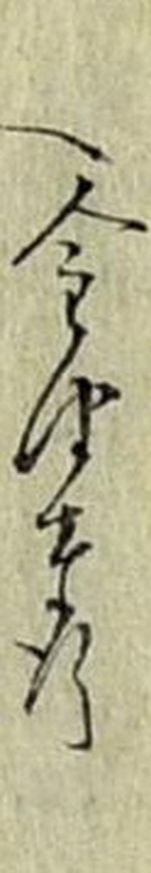金津奉行
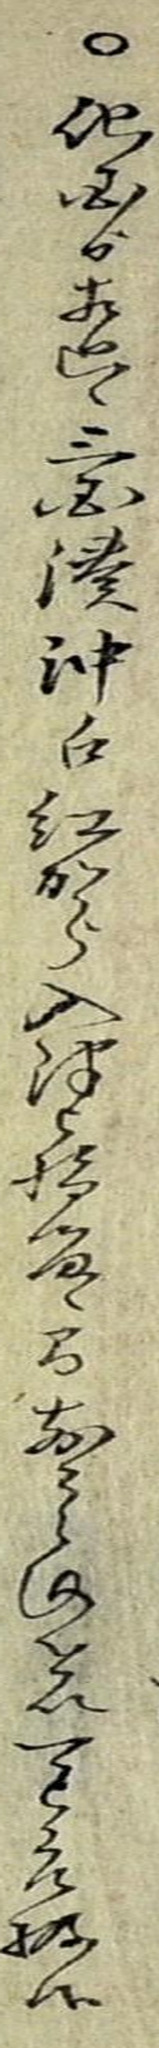○他国ゟ相廻り候三国湊沖之口紅がら入津被指留候間前々之趣を以可被取扱候
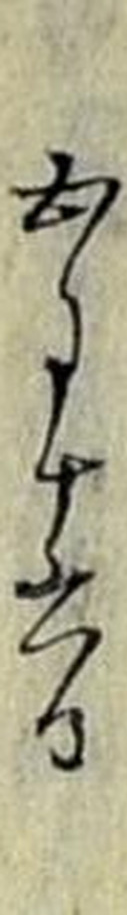五月十六日
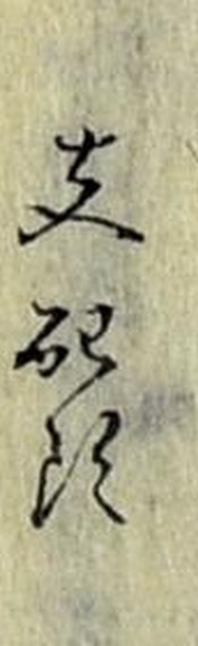支配頭
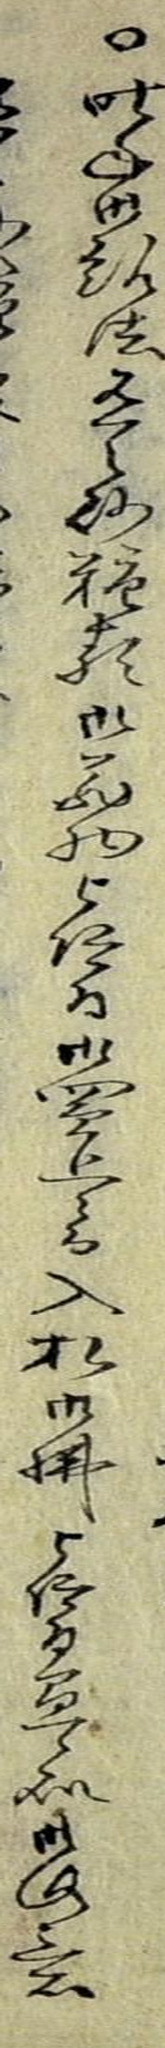○昨年御趣法有之砂類類御蔵物被仰付御買上に而入札御払被仰付置候処御趣意
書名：命令之部 六
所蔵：福井県文書館 Fukui Prefectural Archives
